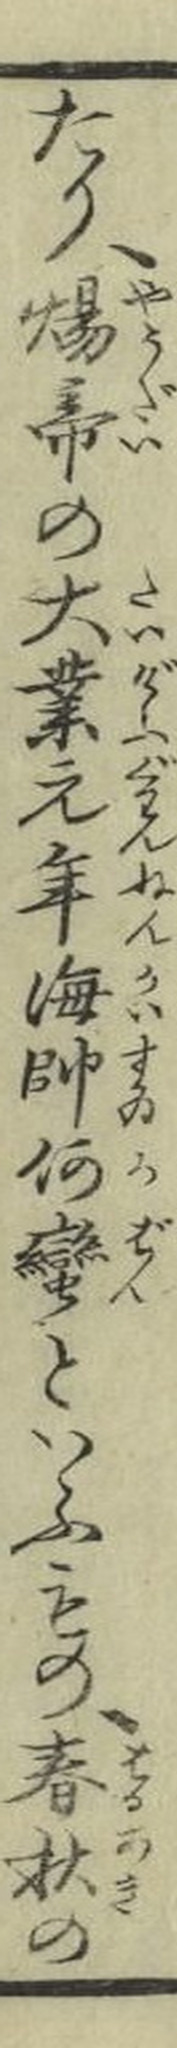たり、煬帝の大業元年海帥何蛮というもの、春秋の

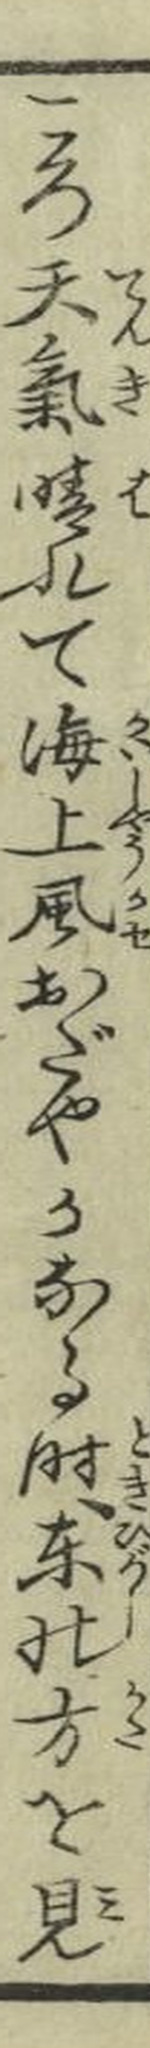ころ天気晴れて海上風おだやかなる時、東の方を見
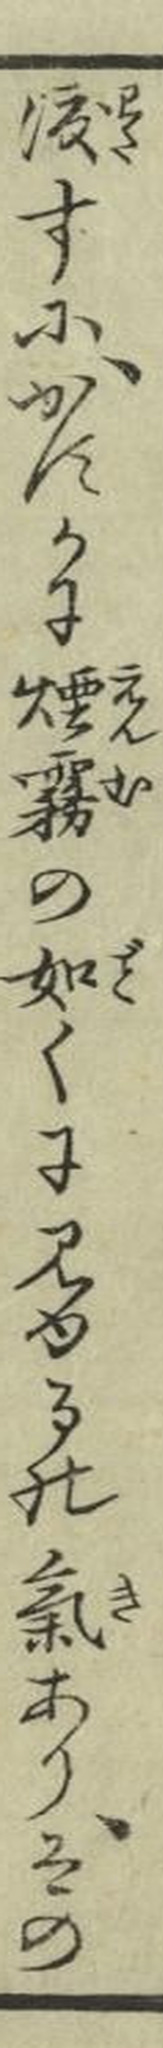渡すに、かすかに煙霧の如くに見ゆるの気あり、その
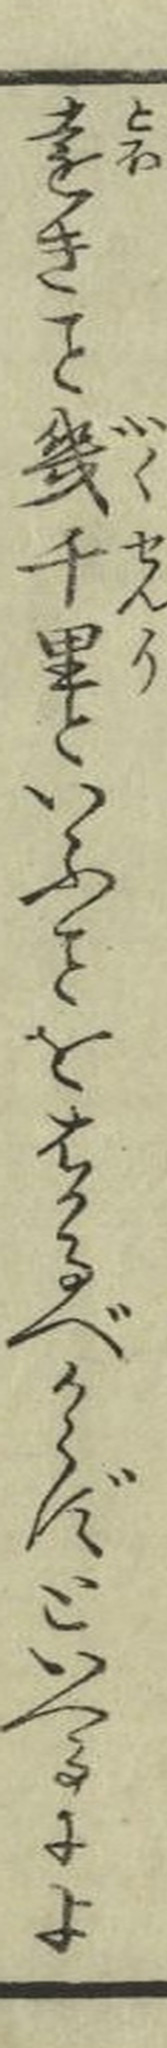遠きこと幾千里といふことをはかるべからずといへるによ
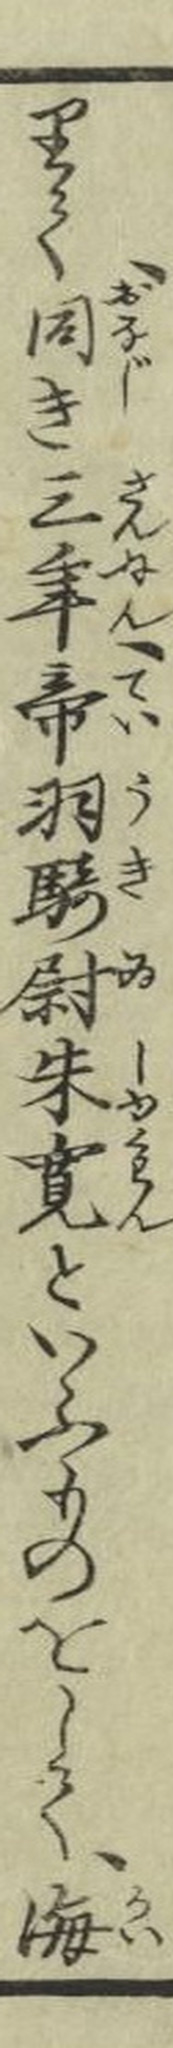りて、同き三年、帝羽騎尉朱寛といふものをして、海
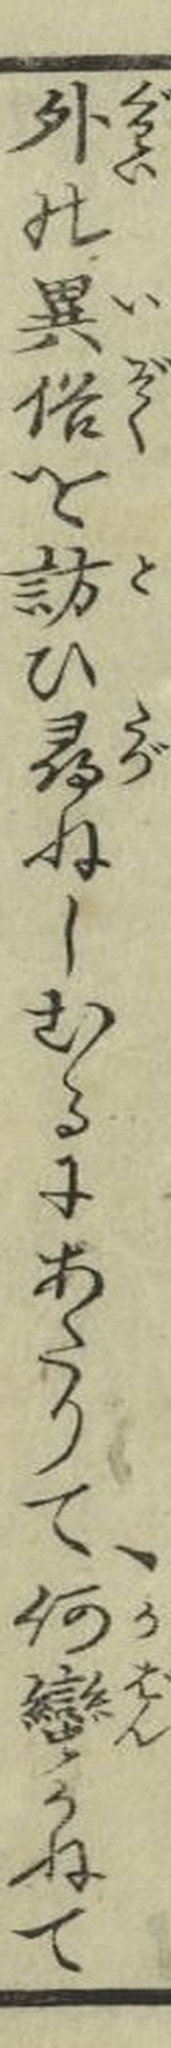外の異俗を訪ひ尋ねしむるにあたりて、何蛮かねて
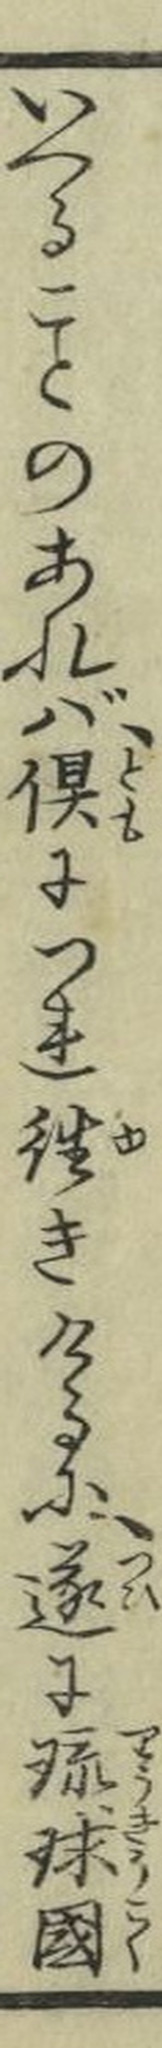いへることのあれば、倶につれ往きけるに、遂に琉球国
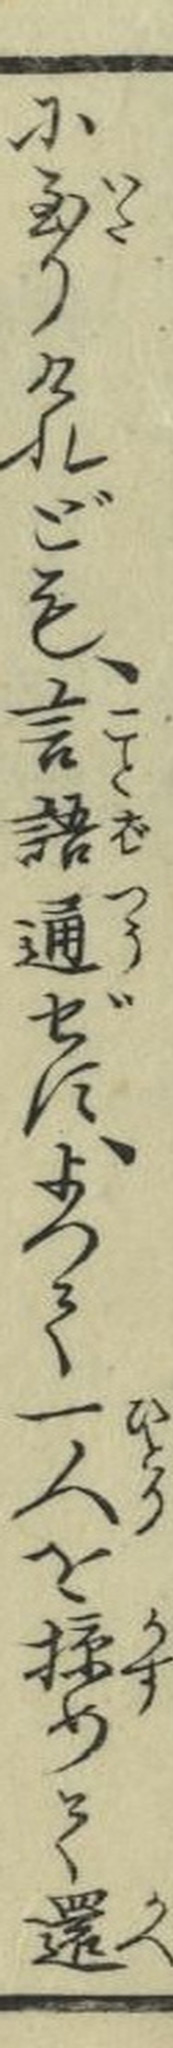に至りけれども、言語通ぜす、よつて一人を掠めて還
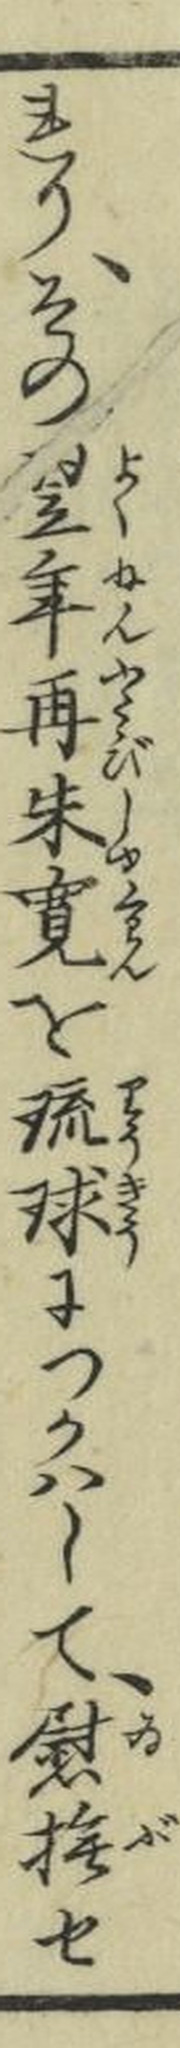れり、その翌年再朱寛を琉球につかはして、慰撫せ
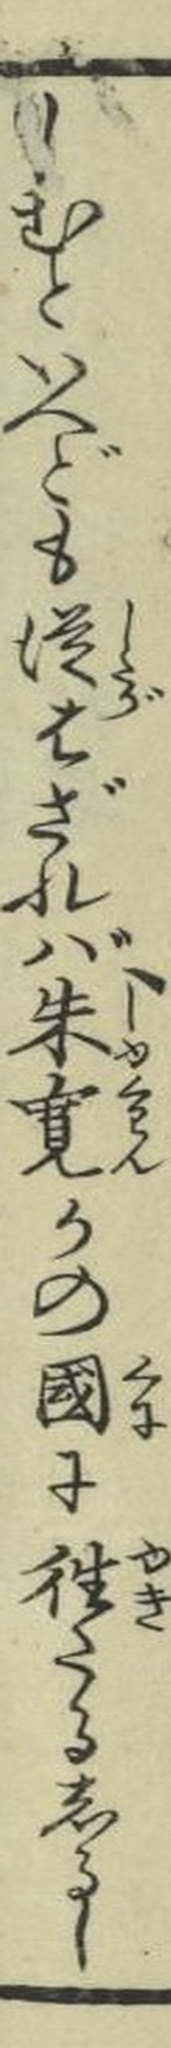しむといへども従はざれば、朱寛かの国に往たるしるし
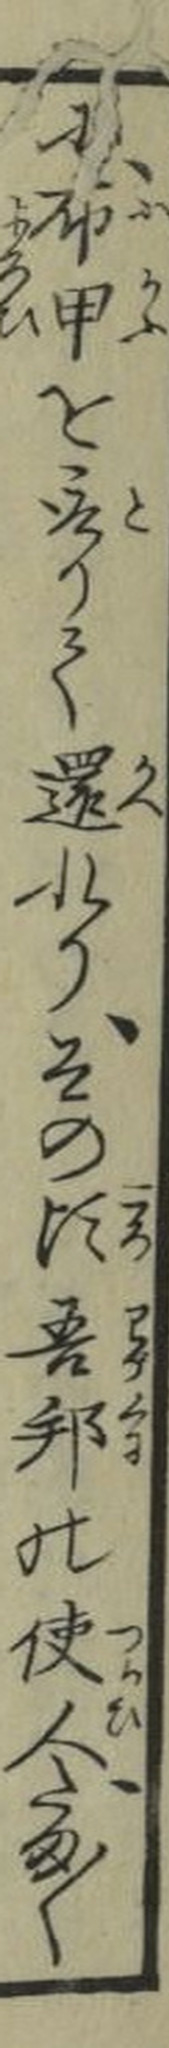に、布甲を取りて還れり、その頃吾邦の使人、たま〳〵
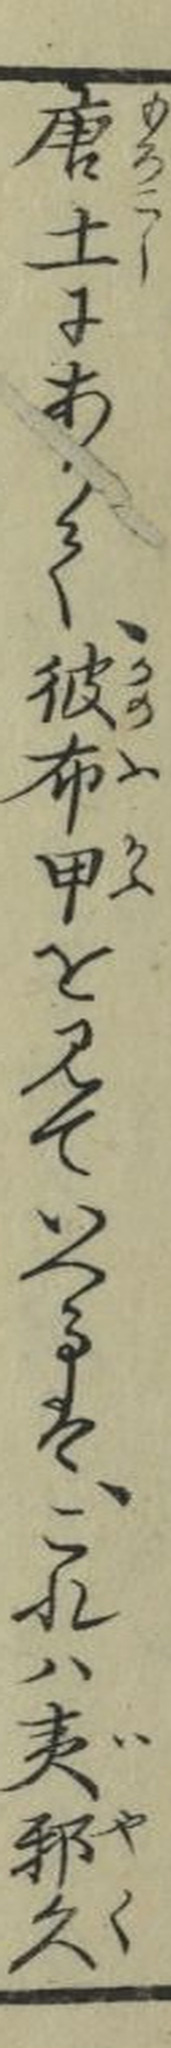唐土にありて、彼布甲を見ていへるは、これは夷邪久
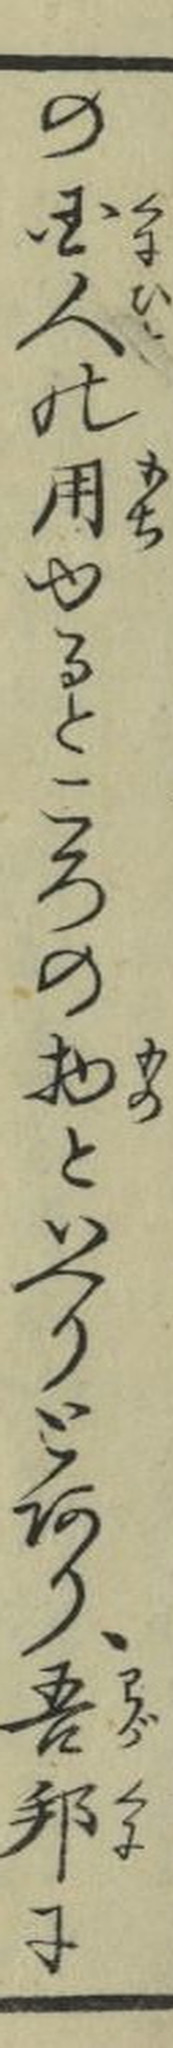の国人の用ゆるところの物といへりとあり、吾邦に
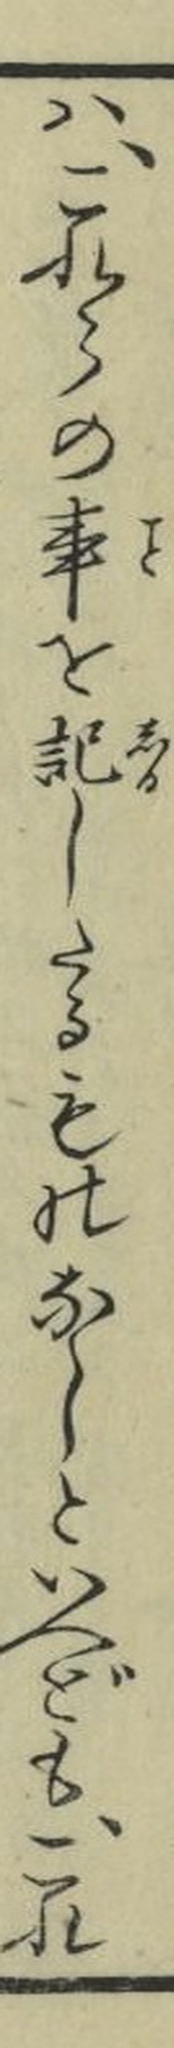は、これらの事を記したるものなしといへども、これ
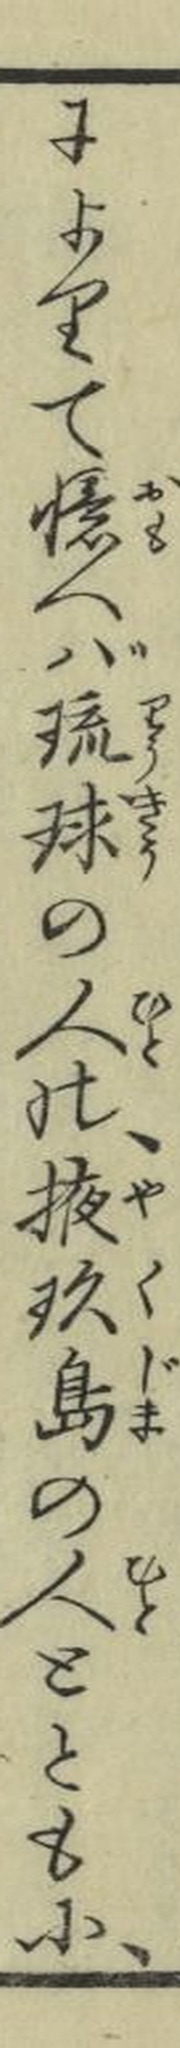によりて憶へば琉球の人の、掖玖島の人とともに、
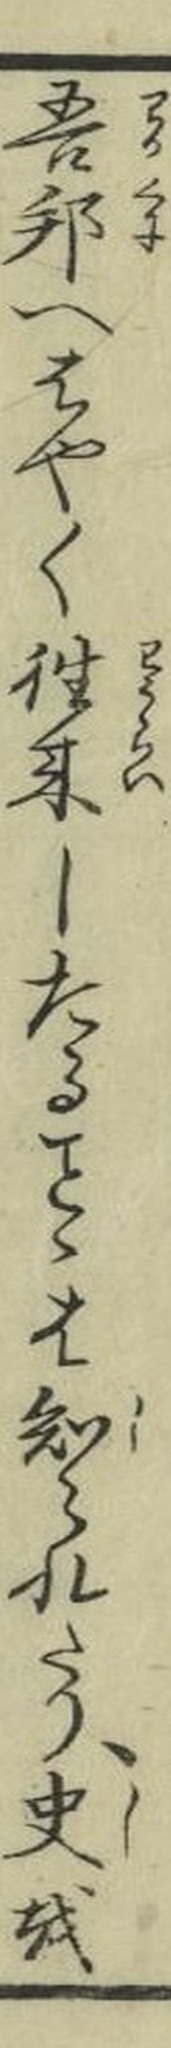吾邦へはやく往来したることゝは知られたり、史を
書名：琉球入貢紀略
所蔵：University of the Ryukyus Library
